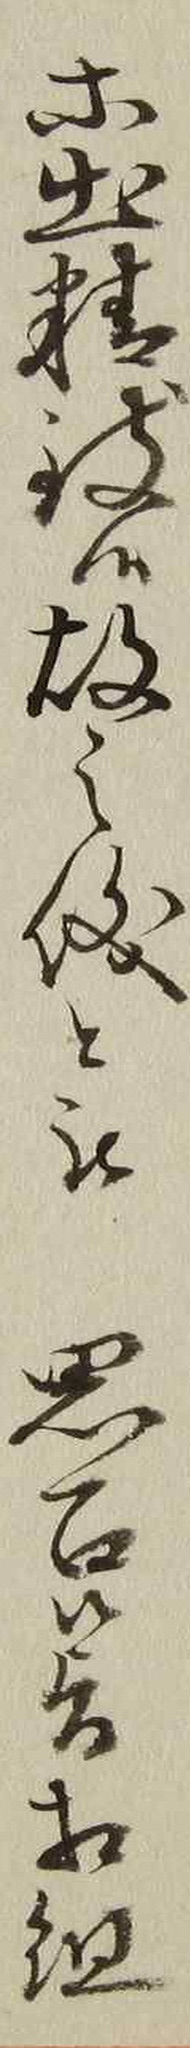等出精致候故之儀と被思召候旨相組
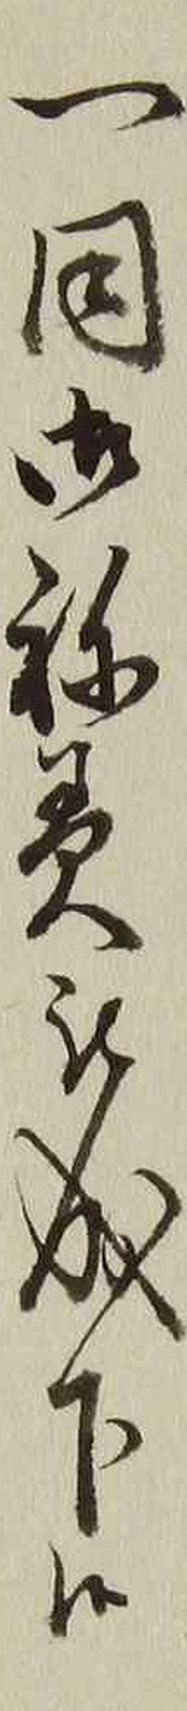一同御称被成下候
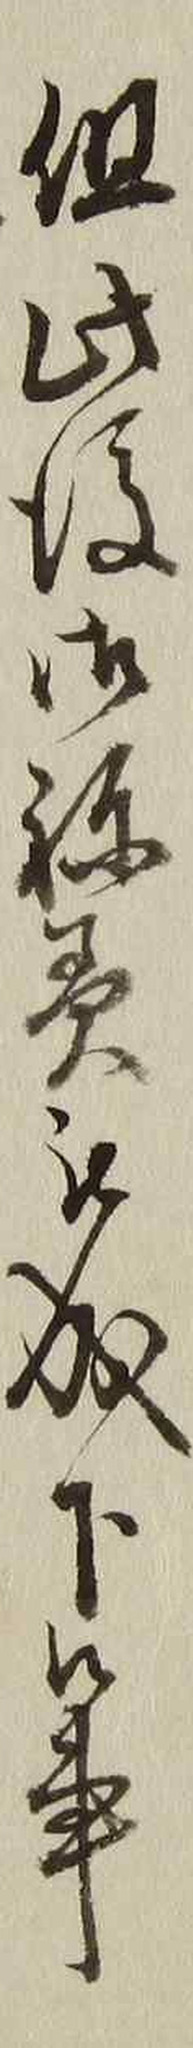但此後御称美被成下候事
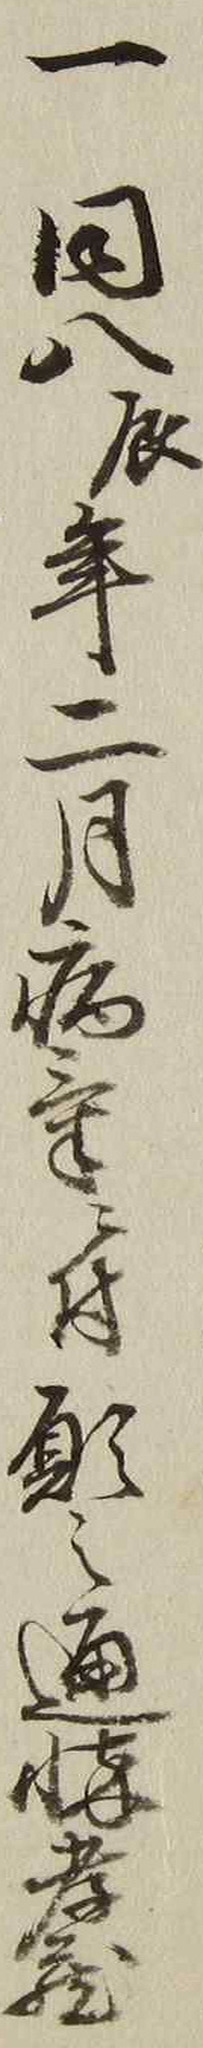一同八辰年二月病気ニ付願之通悴孝蔵
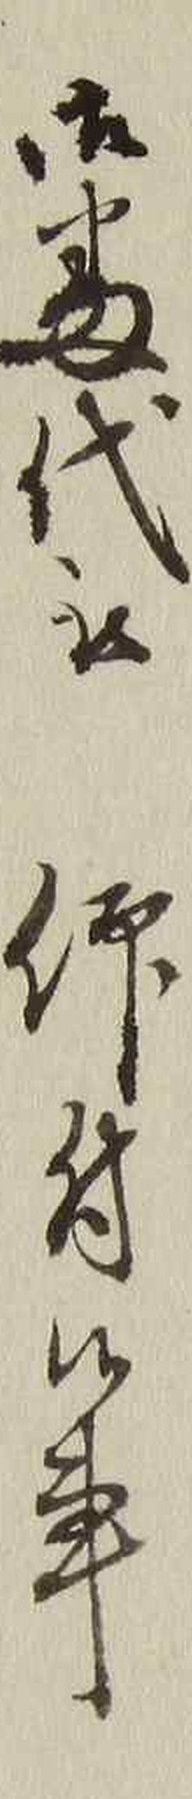御番代被仰付候事
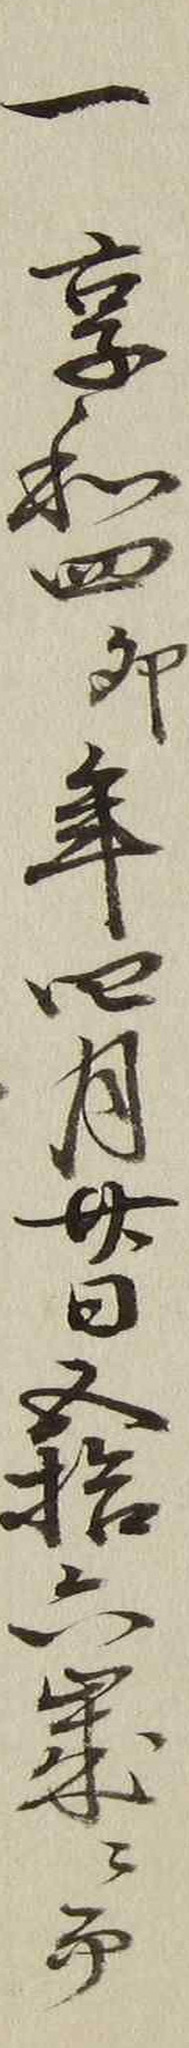一享和四卯年四月廿日五拾六歳ニ而
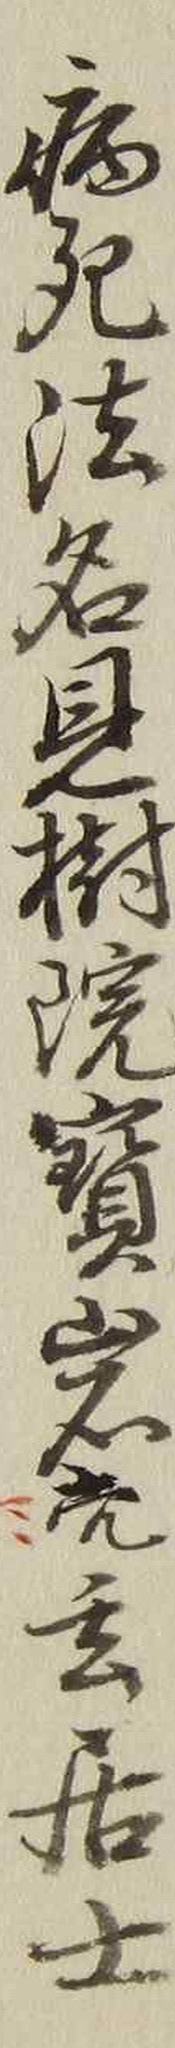病死法名見樹院宝岩石穴玄居士
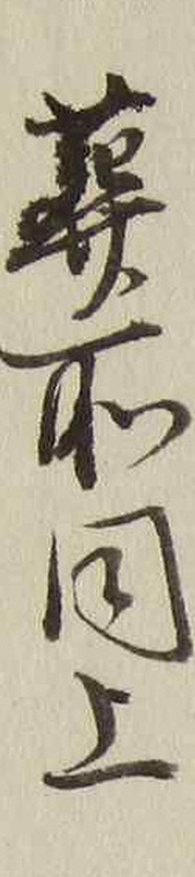葬所同上

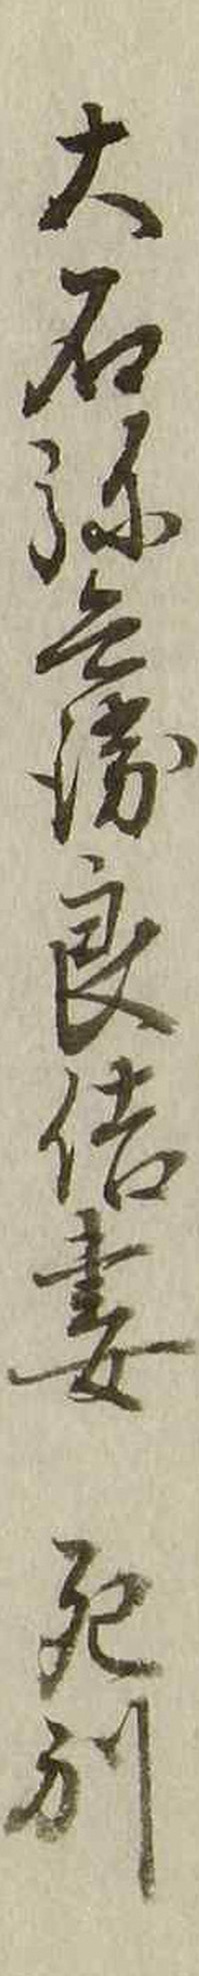女大石弥兵衛良佶妻死別
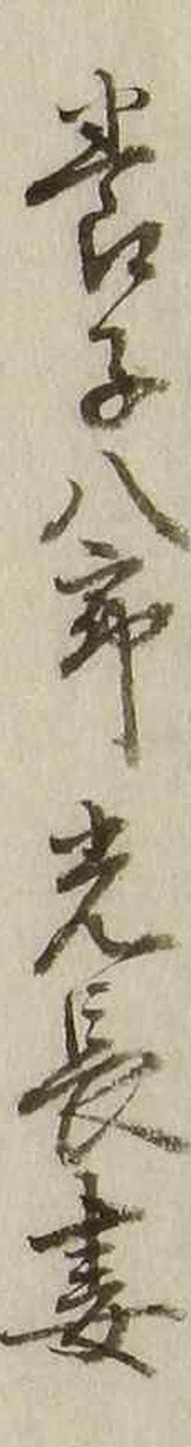養子八郎光長妻
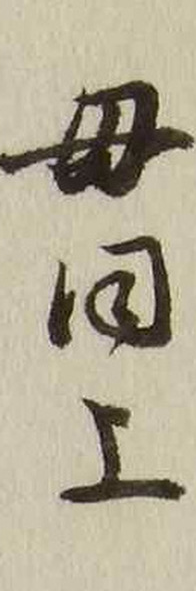母同上
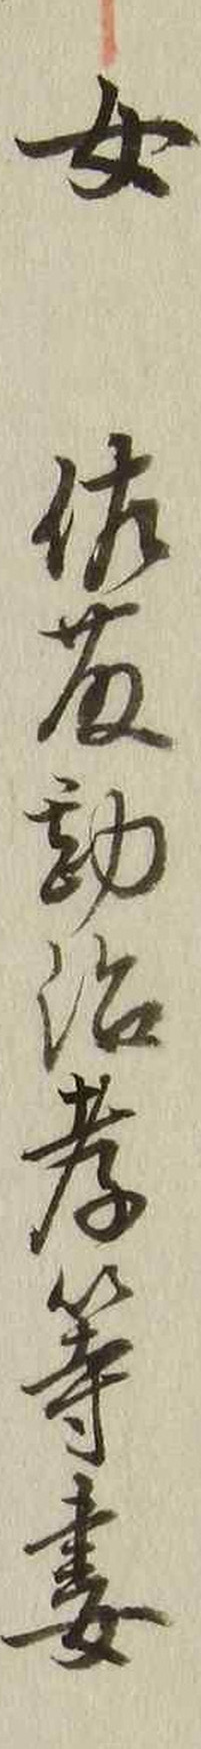女佐藤勘治孝等妻
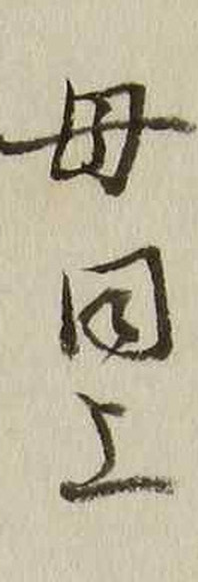母同上
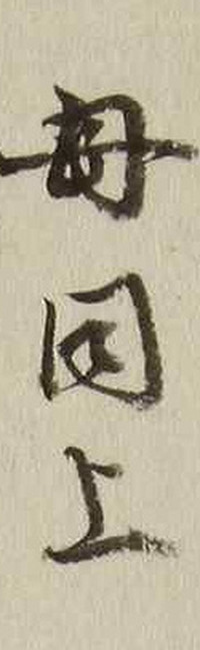母同上
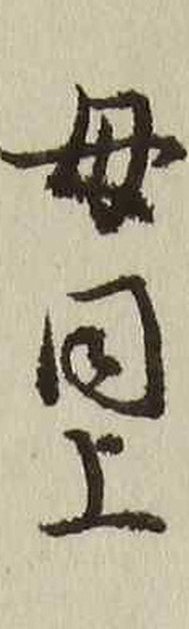母同上
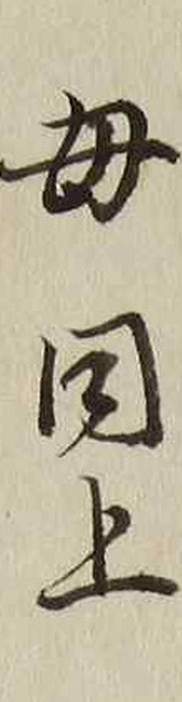母同上
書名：諸士系譜　巻之27　い之部27
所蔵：会津若松市立会津図書館
